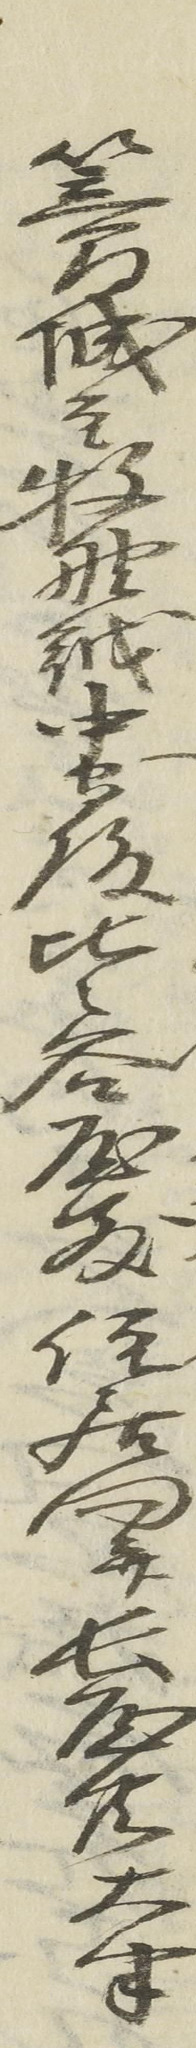一笠間城主牧野越中守殿比〻谷屋敷住居向幷長屋共大半
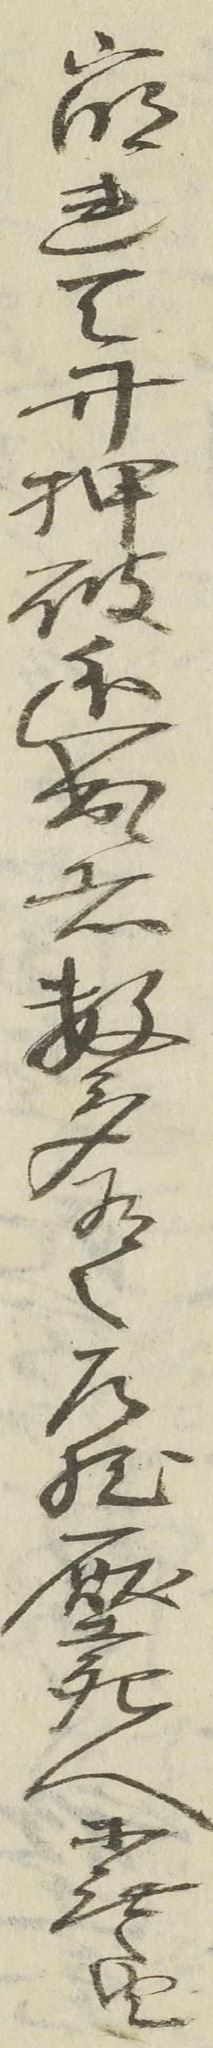崩れ天井押破逃出者数多有之屋敷圧死人等無之由
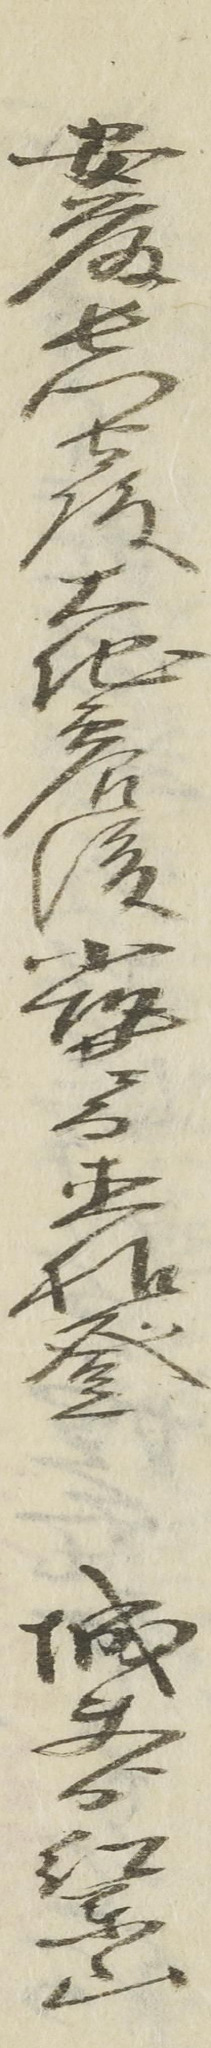一安藤長門守殿大地震後小勢ニ而直様登城夫ゟ紅葉山
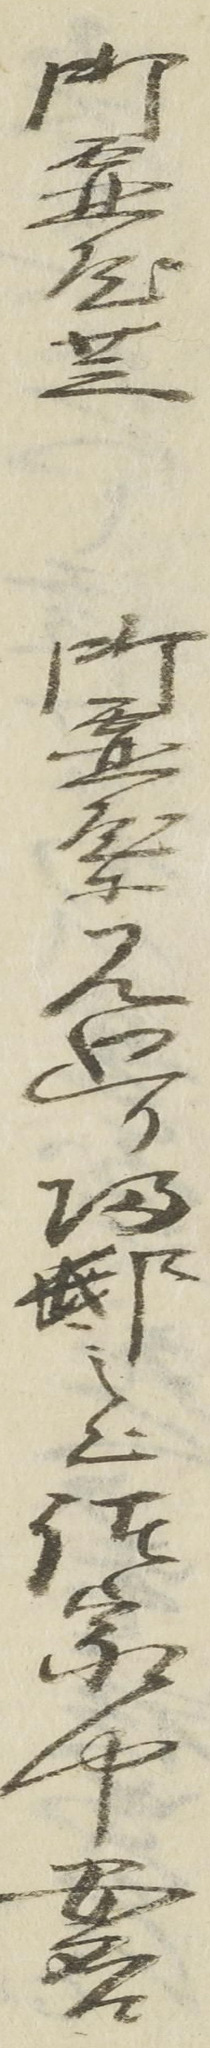御霊屋芝御霊屋等見廻り帰邸之上諸家中安否
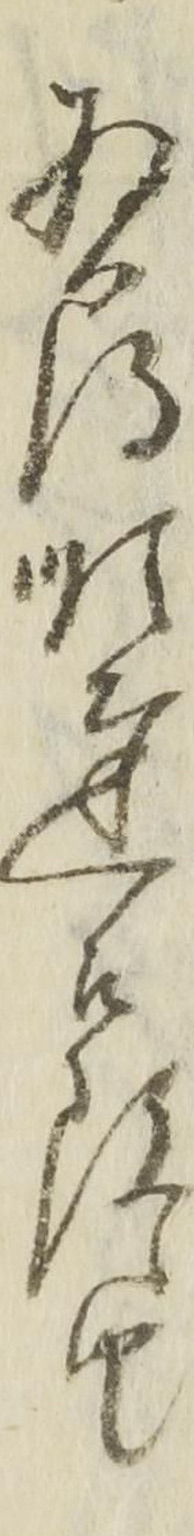為尋順達被致候由
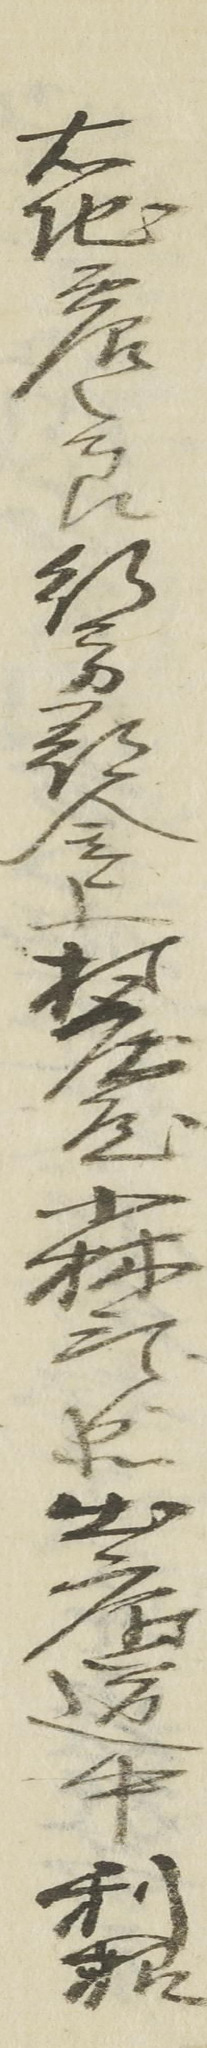一右地震之節行方郡会上村庄屋小森三郎兵衛出府道中利根
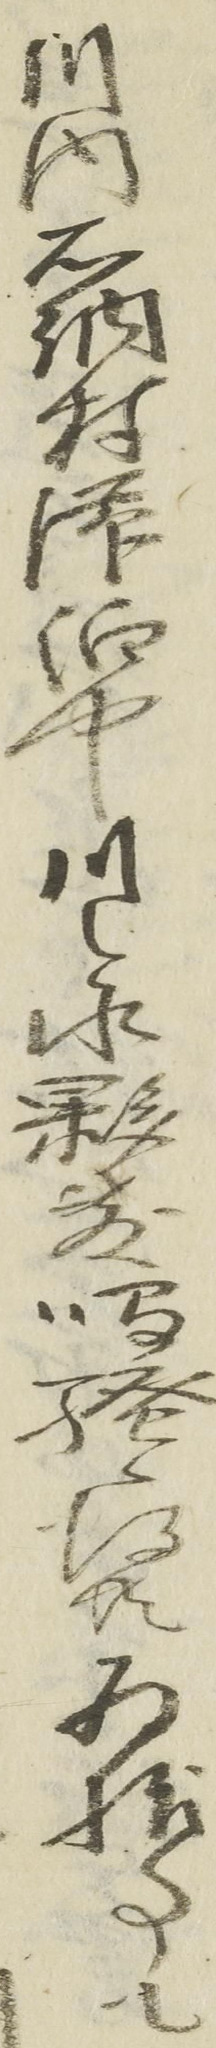川内石納村滞泊中川之水夥敷鳴騒候得共何様事も
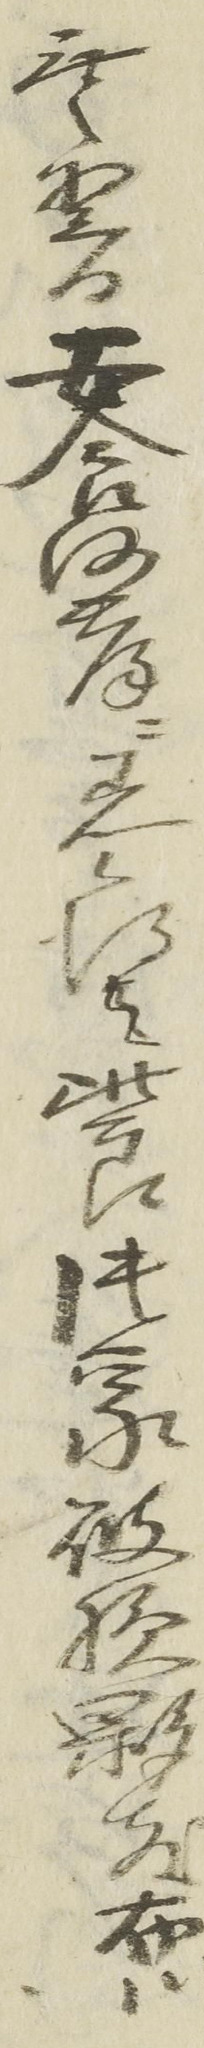無之翌日安食河岸ニ着候得は此節潰家破損夥敷布川
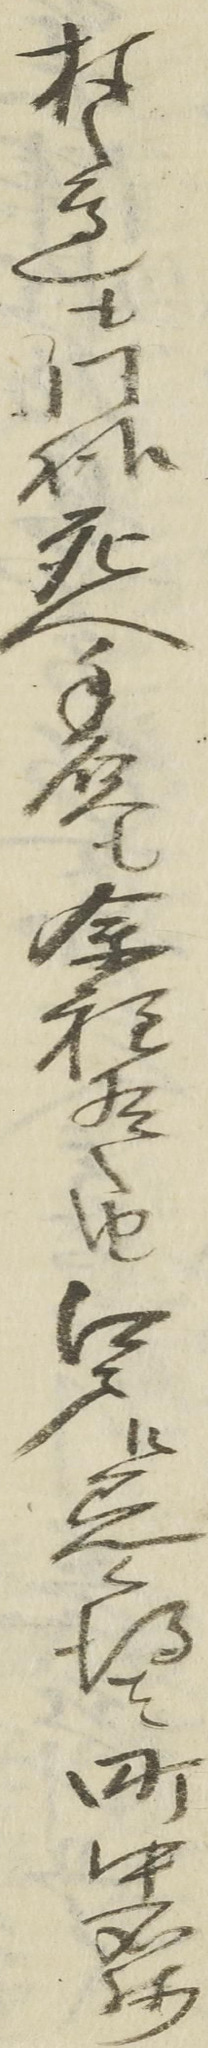村之辺も同様死人手負も余程有之由江戸江着候得は町中不残
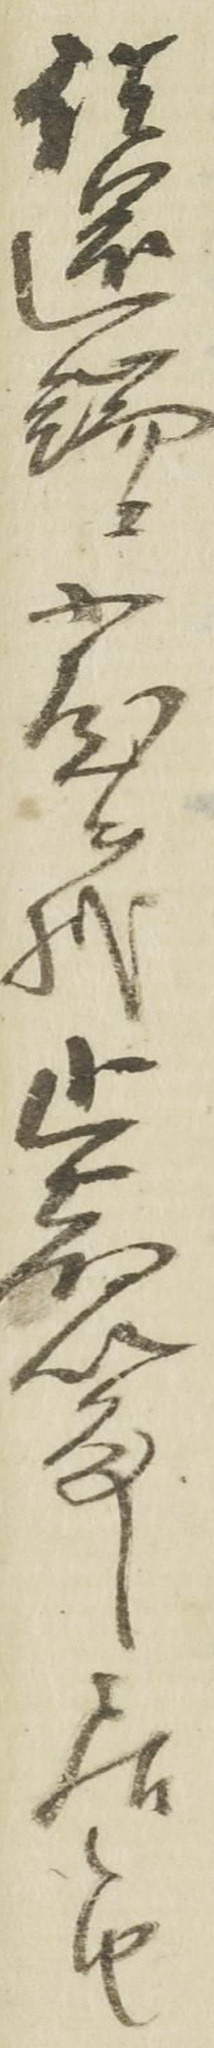往還端ニ小屋を掛止宿いたし居候由
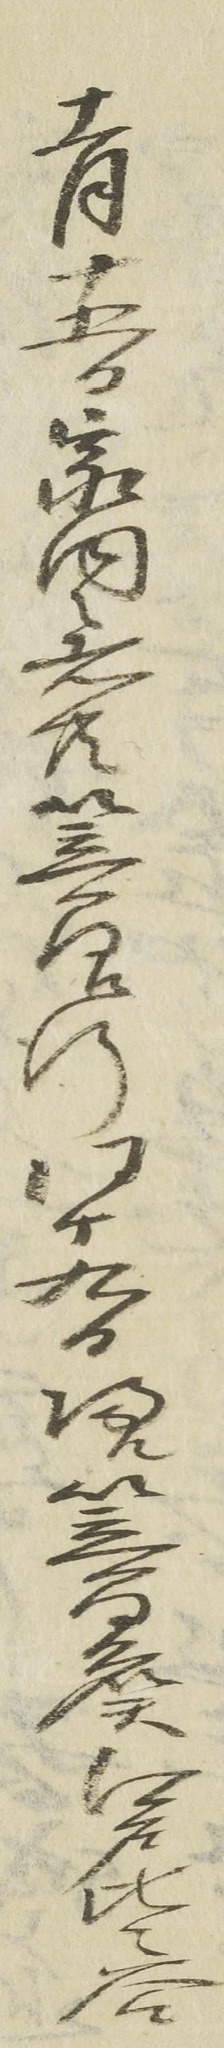一十一月十五日家内之者共笠間江行同十九日帰ル笠間侯江戸比〻谷
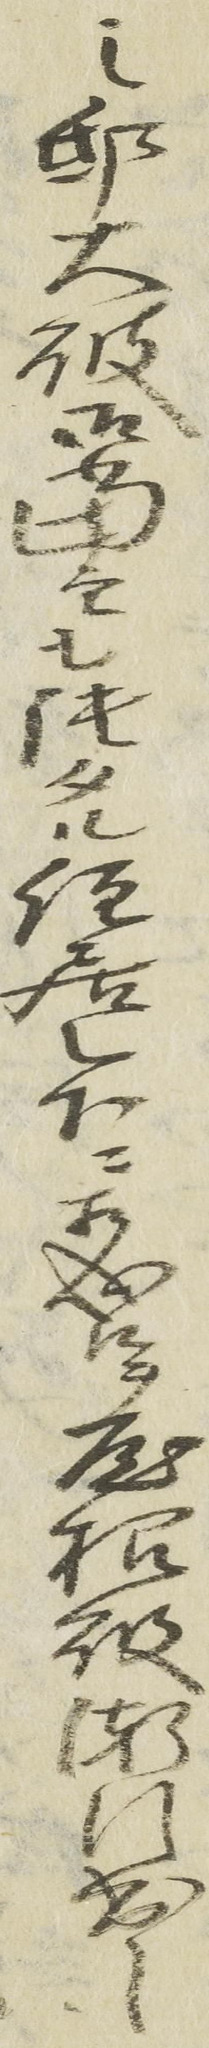之邸大破御当主も潰タル住居之下二相成候ヲ屋根役漸引出し
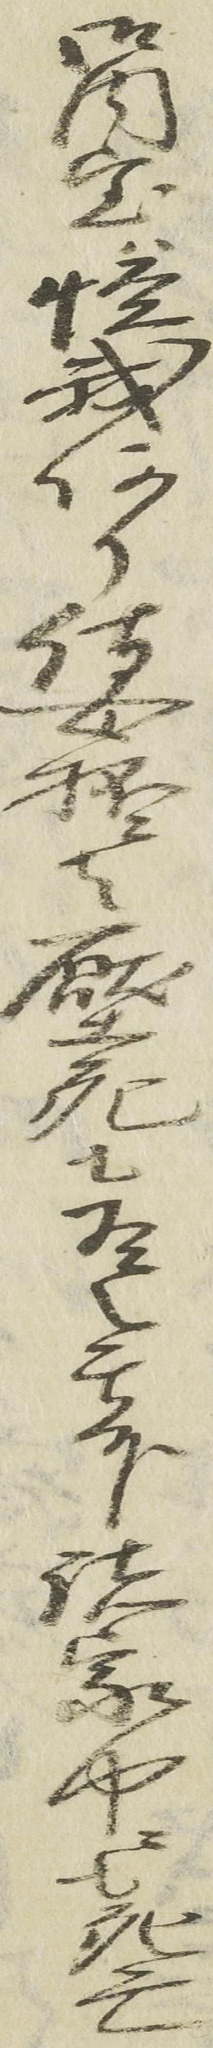御内室ハ怪我あり侍女抔ニは圧死も有之其外諸家中ニも死亡
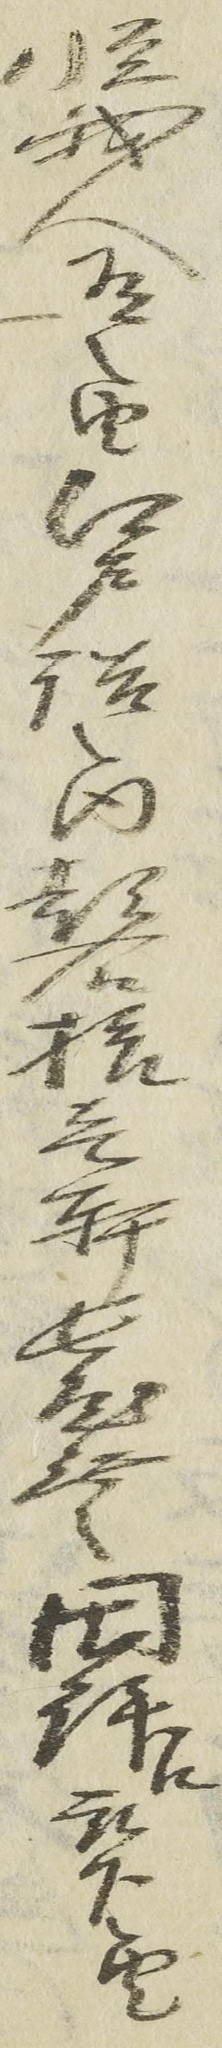怪我人有之由江戸詰之内都合拾壱軒長屋無之国許江被下候由
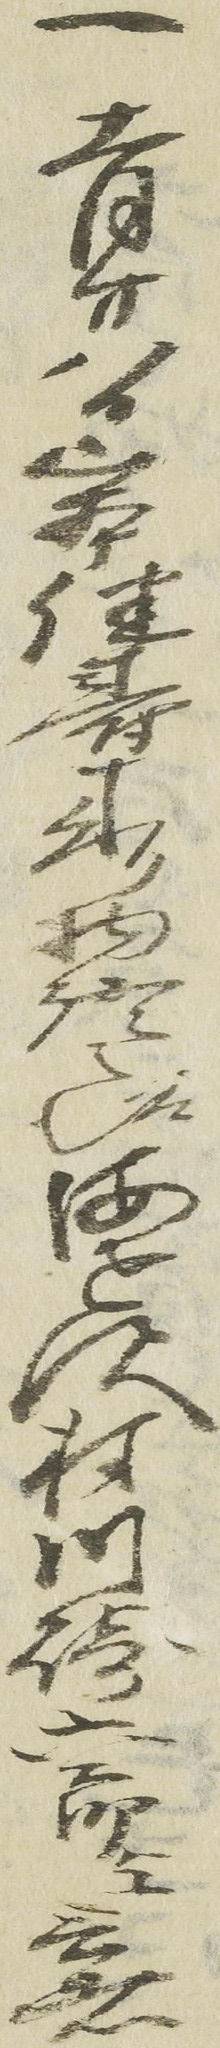一十一月廿八日山本健壽来り物語之趣酒と沢村川崎六郎と云者
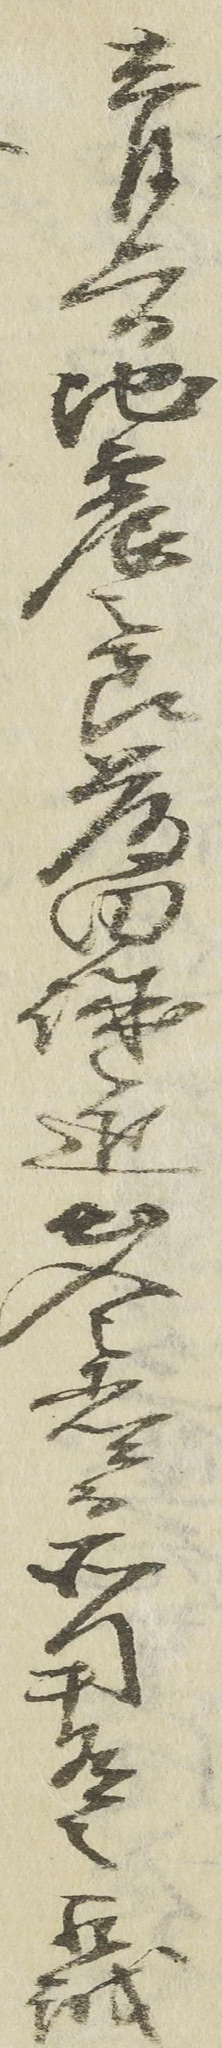去月二日地震之節藤田誠之進出入之者ニ而所用有之罷越
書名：安政乙卯江戸大地震筆記　安政丙辰八月大阪大雷雨之記追加　安政三辰年七月松前辺大地震并八月大風雨記録
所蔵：東京大学地震研究所図書室 Earthquake Research Institute Library, The University of Tokyo, JAPAN
